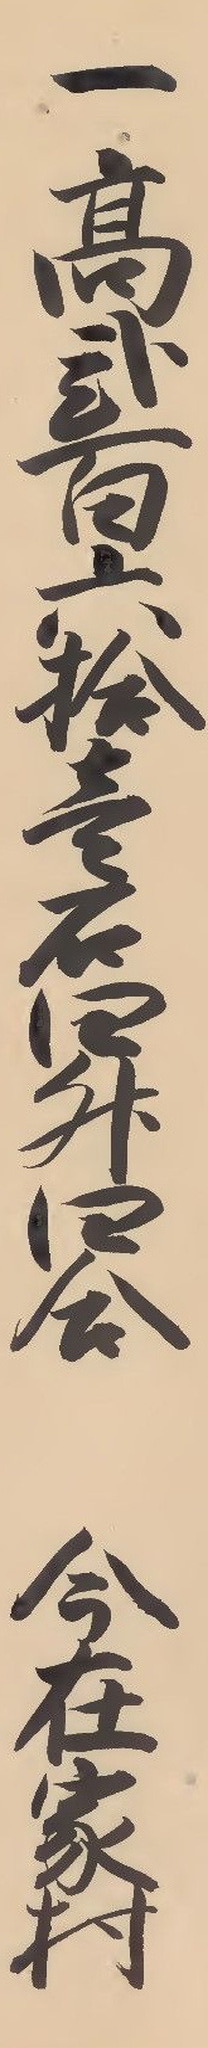一高弐百六拾壱石四升四合今在家村
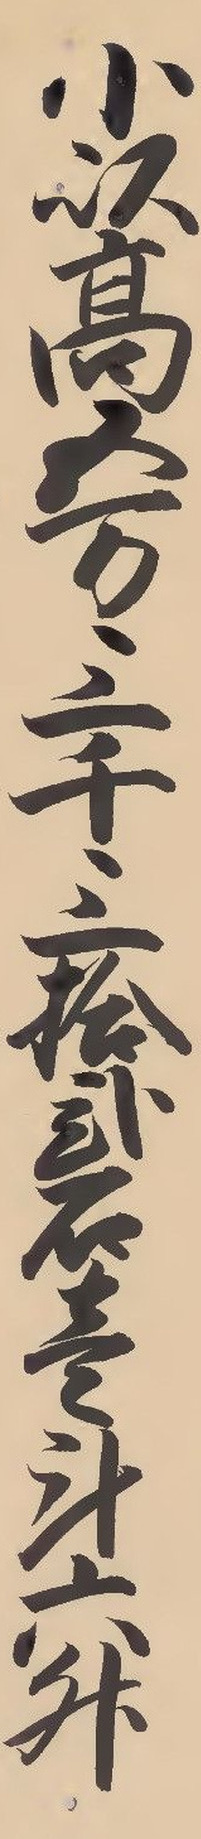小以高五万三千三拾弐石壱斗六升

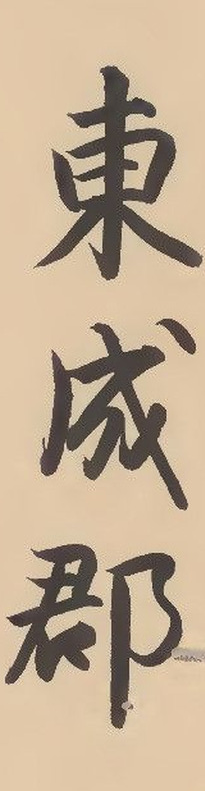東成郡
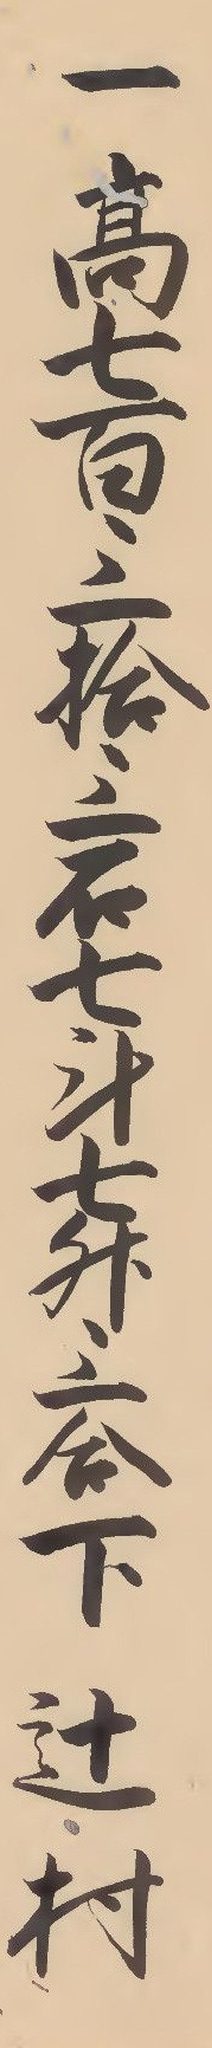一高七百三拾三石七斗七升三合下辻村
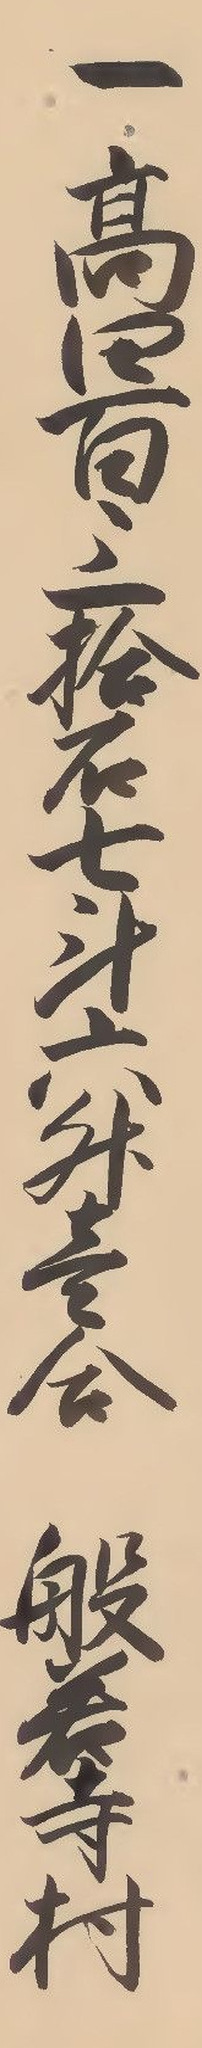一高四百三拾石七斗六升壱合般若寺村
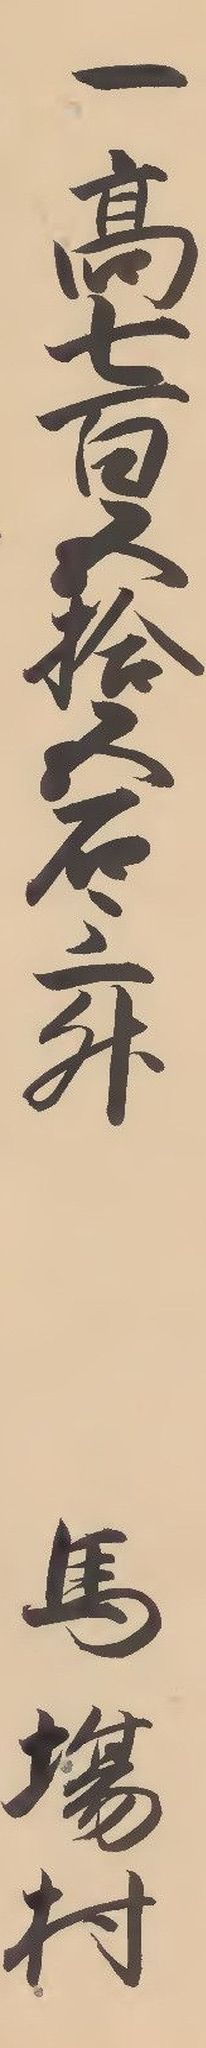一高七百五拾五石三升馬場村
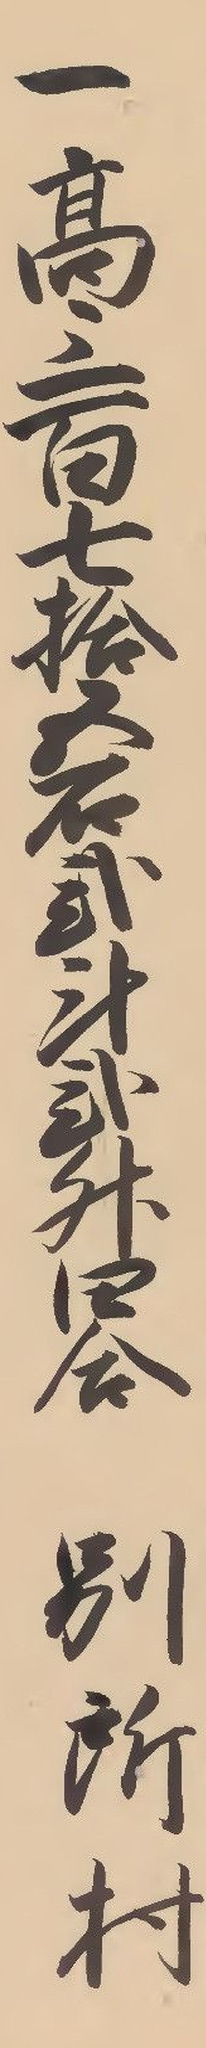一高三百七拾五石弐斗弐升四合別所村
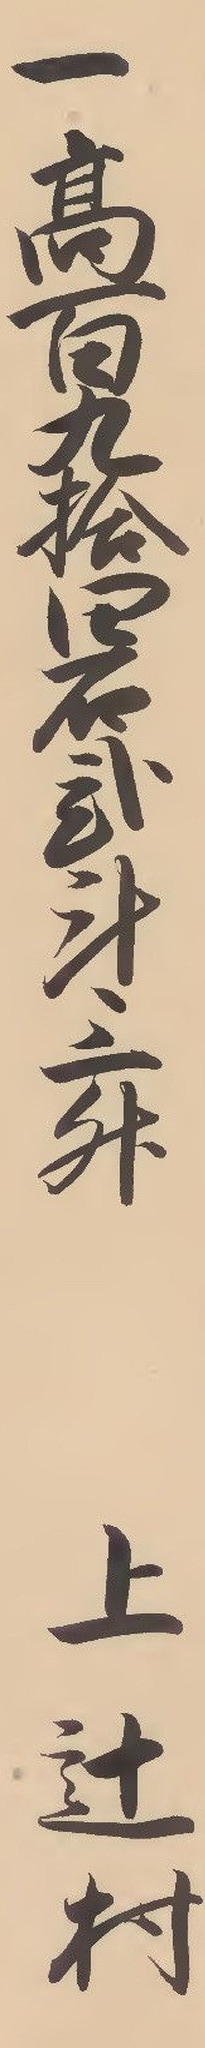一高百九拾四石弐斗三升上辻村
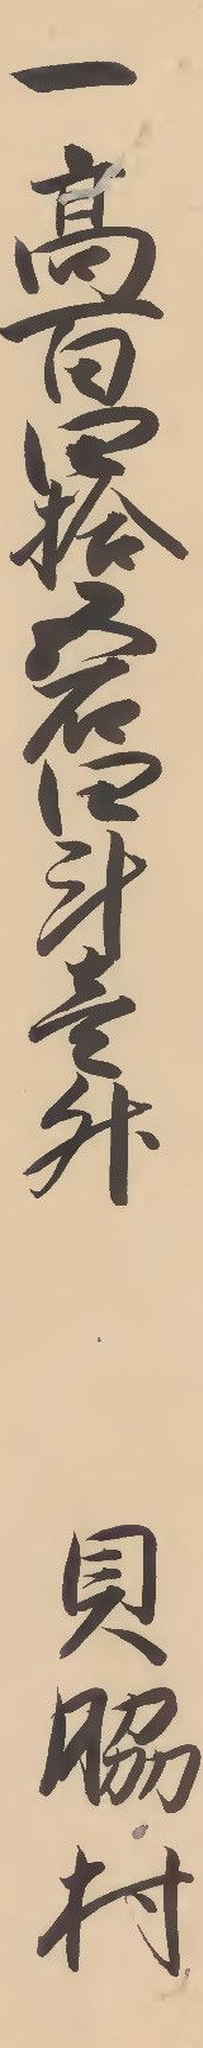一高百四拾五石四斗壱升貝脇村
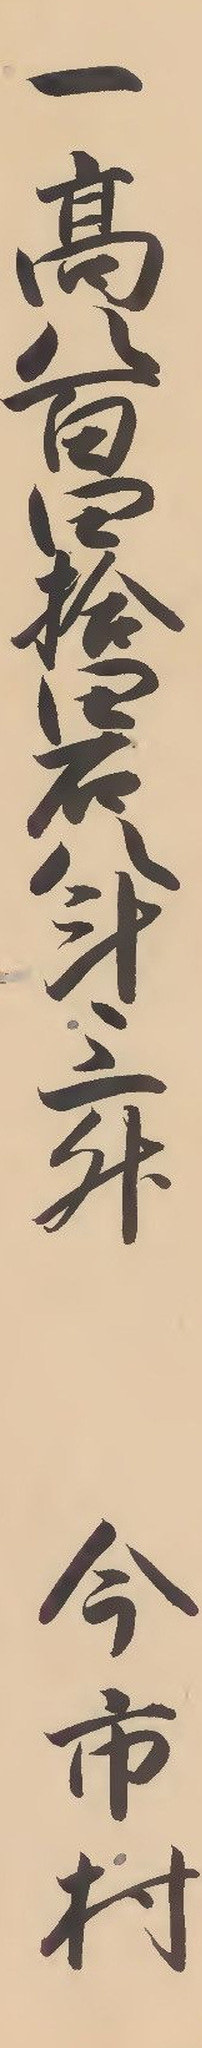一高八百四拾四石八斗三升今市村

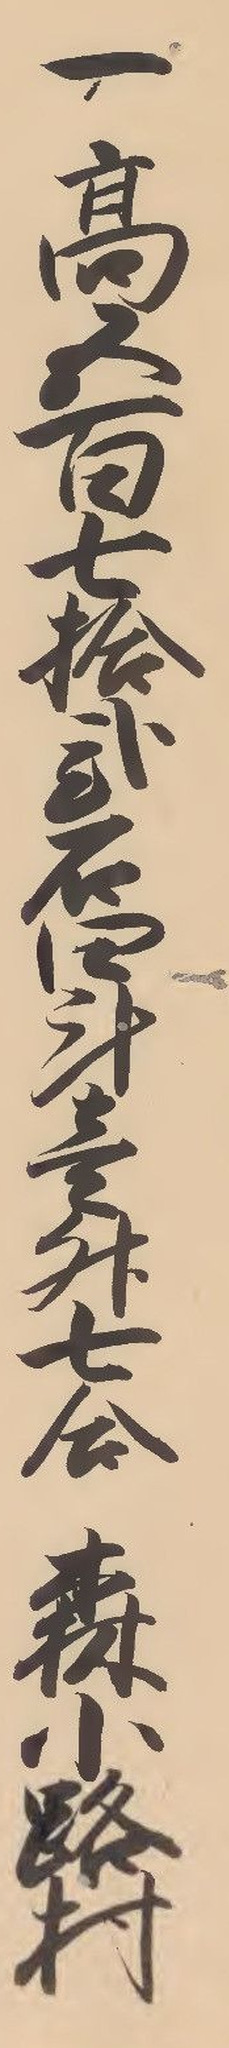一高五百七拾弐石四斗壱升七合森小路村
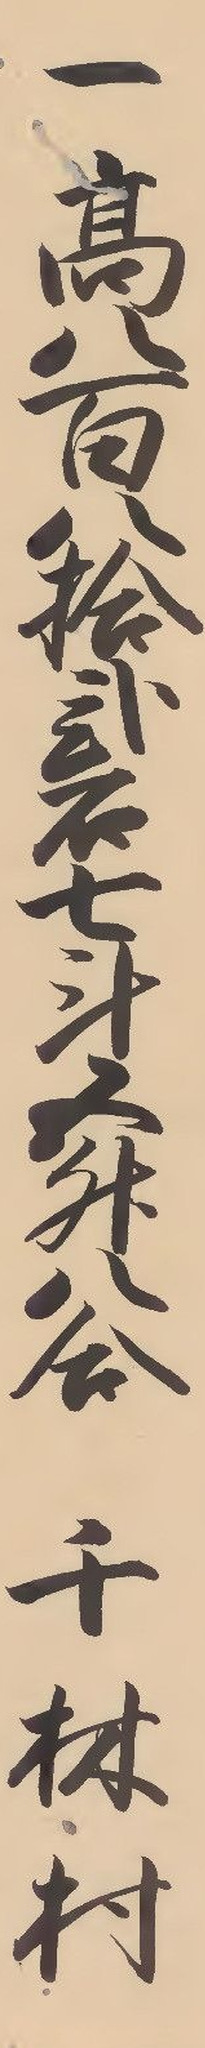一高八百八拾弐石七斗五升八合千林村
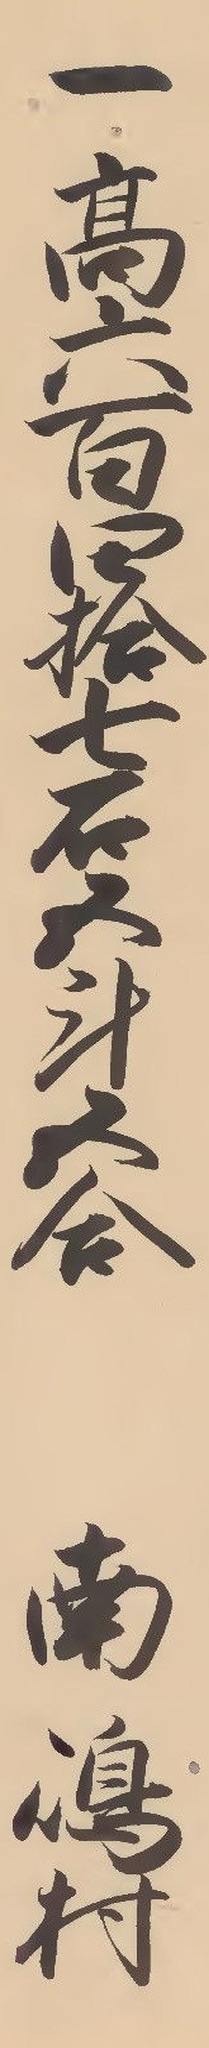一高六百四拾七石五斗五合南島村
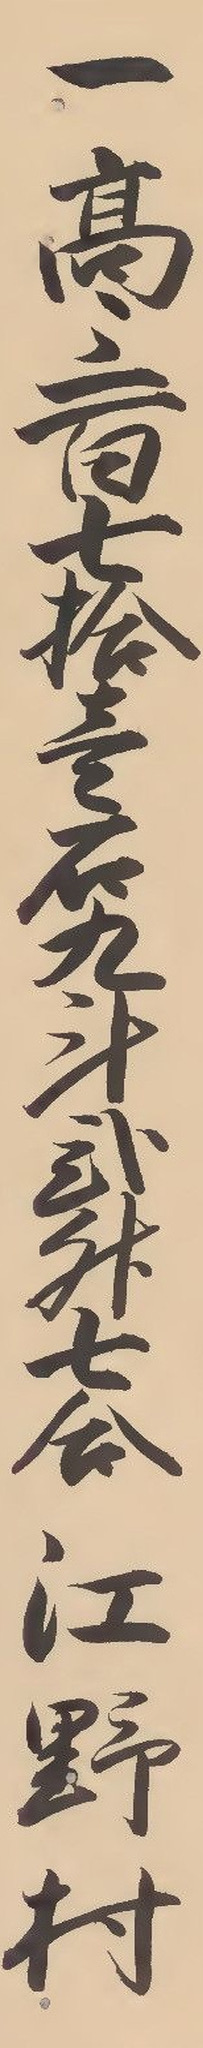一高三百七拾壱石九斗弐升七合江野村
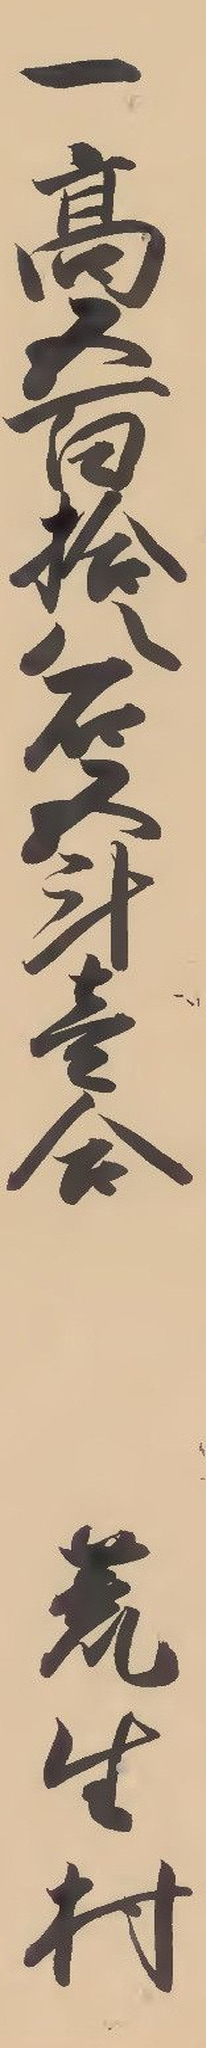一高五百拾八石五斗壱合荒生村
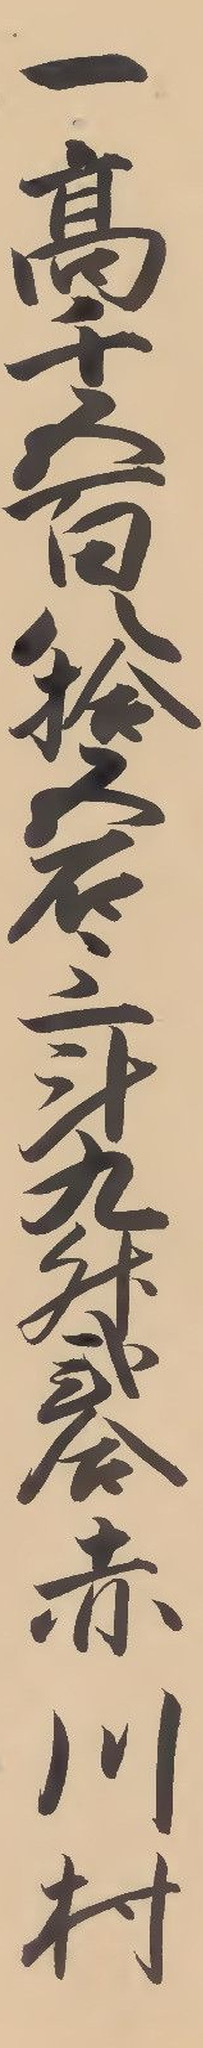一高千五百八拾五石三斗九升弐合赤川村
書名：摂津国郷帳
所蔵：国立公文書館 National Archives of Japan
